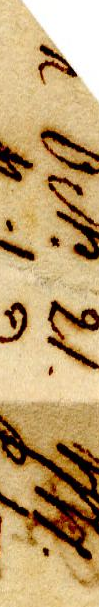Oct^r. 21 1777.
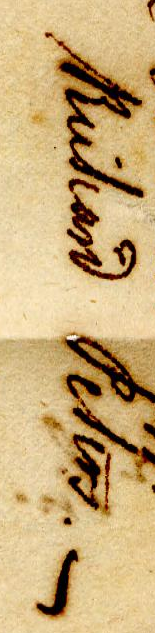Richard Peters.-
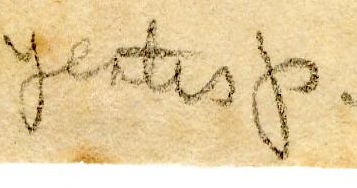Yeates J
